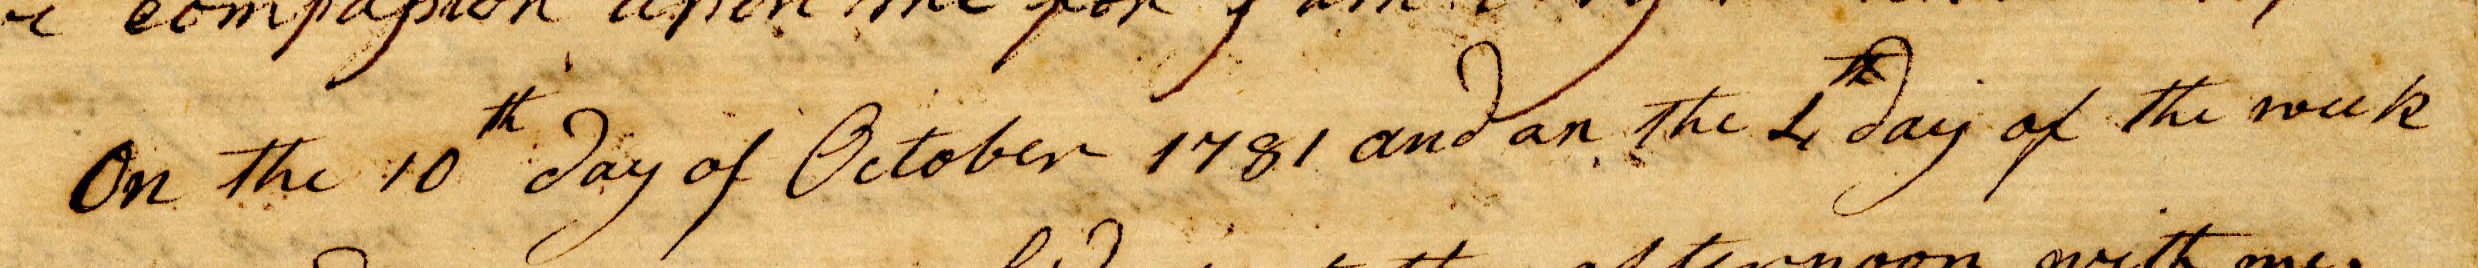On the 10^th day of October 1781 and on the 4^th day of the week
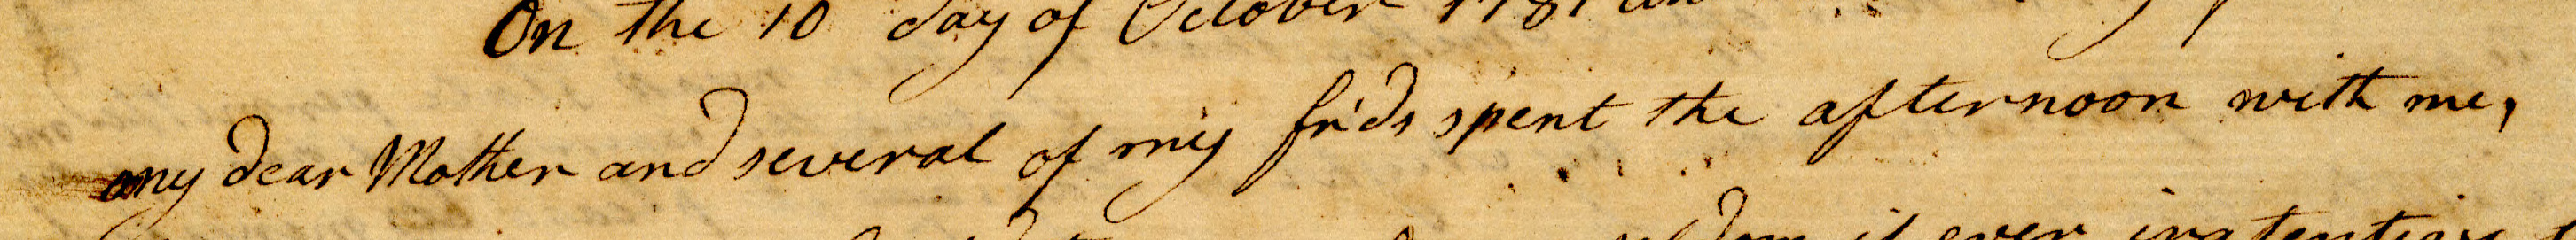my dear Mother and several of my frids spent the afternoon with me,
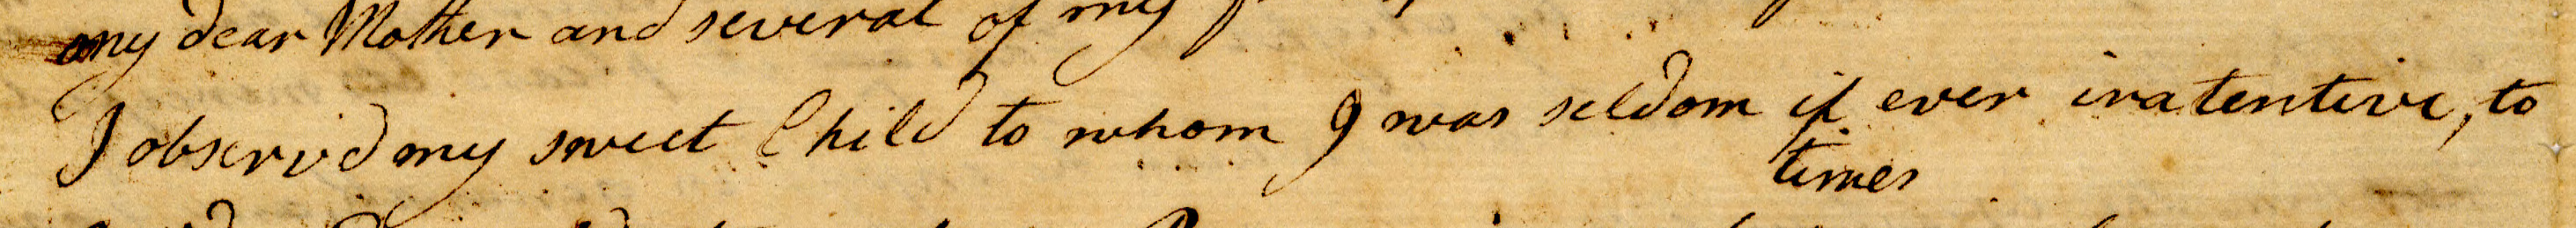I observd my sweet Child to whom I was seldom if ever inatentive, to
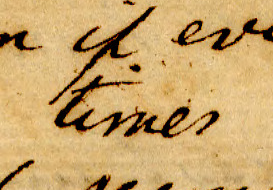times
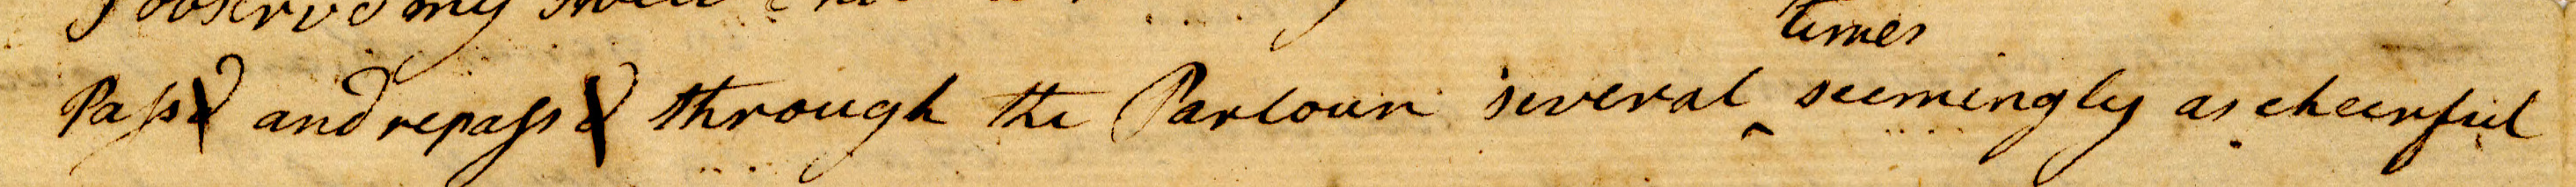Pass[d] and repass[d] through the Parlour several ^ seemingly as cheerful
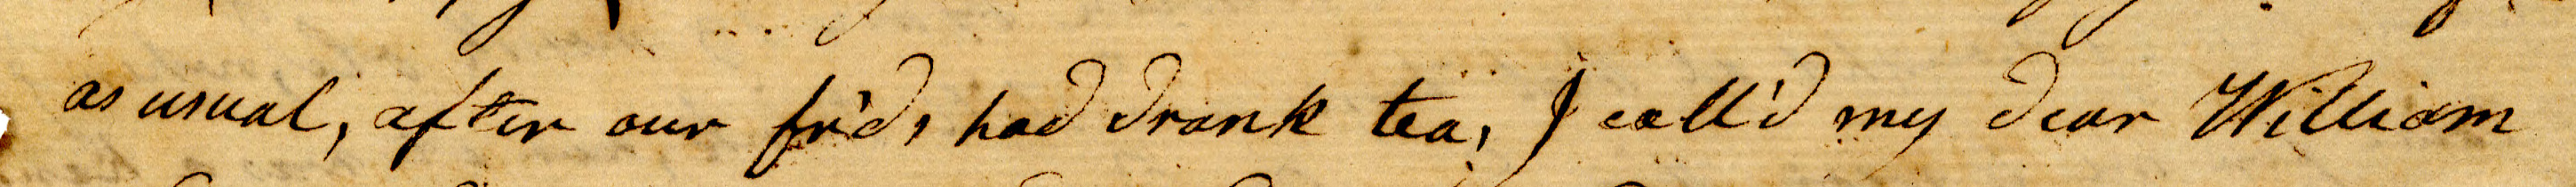as usual, after our frids had drank tea, I call'd my dear William
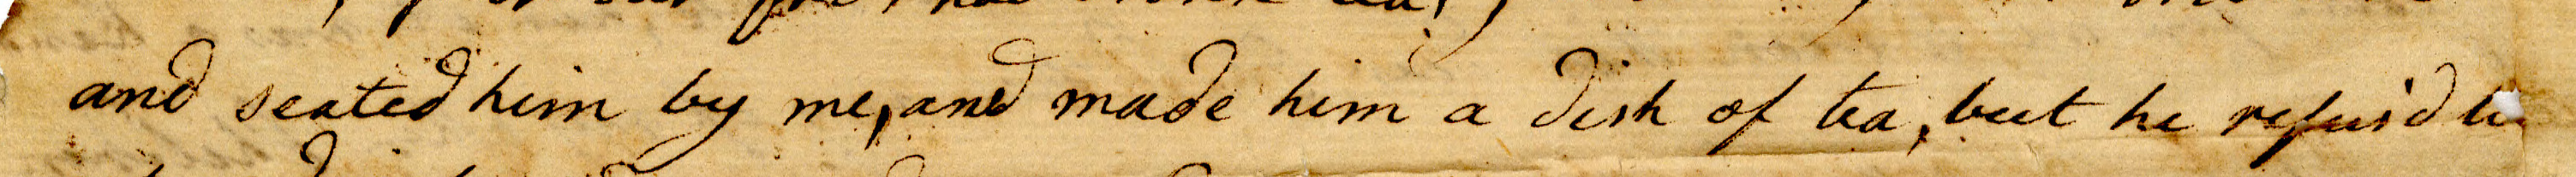and seated him by me, and made him a dish of tea, but he refus'd to
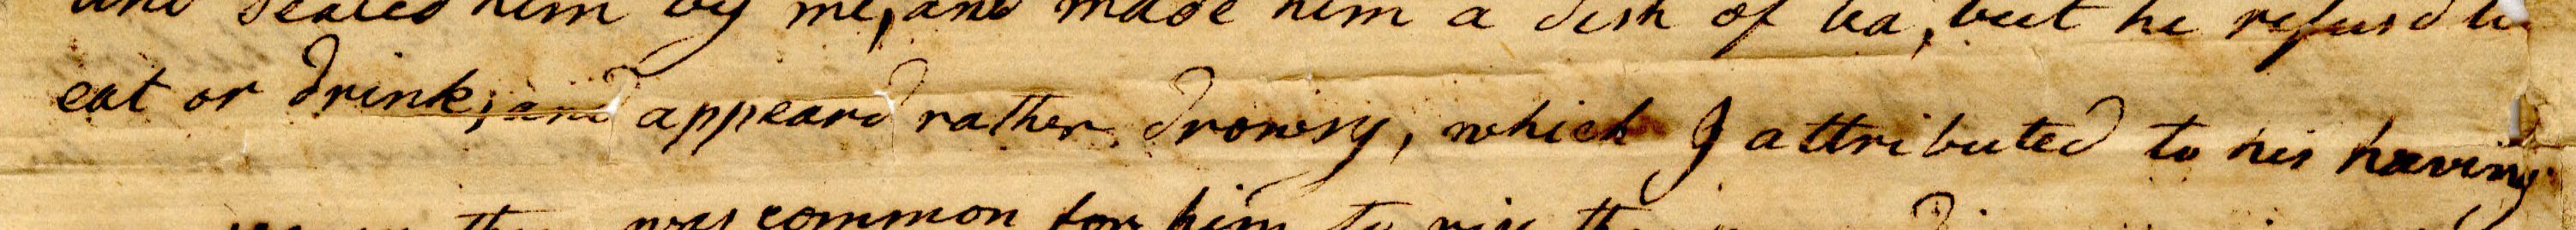eat or drink, and appeared rather drowsy, which I attributed to his having
